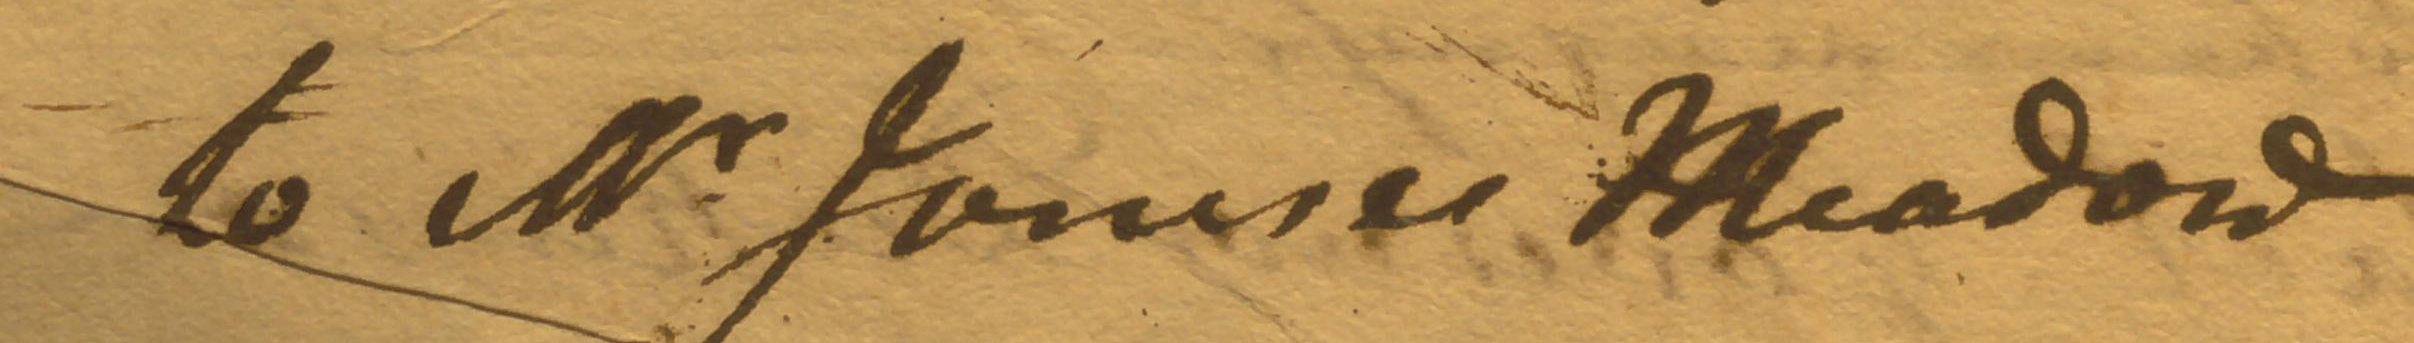to M^r. Joneses Meadow
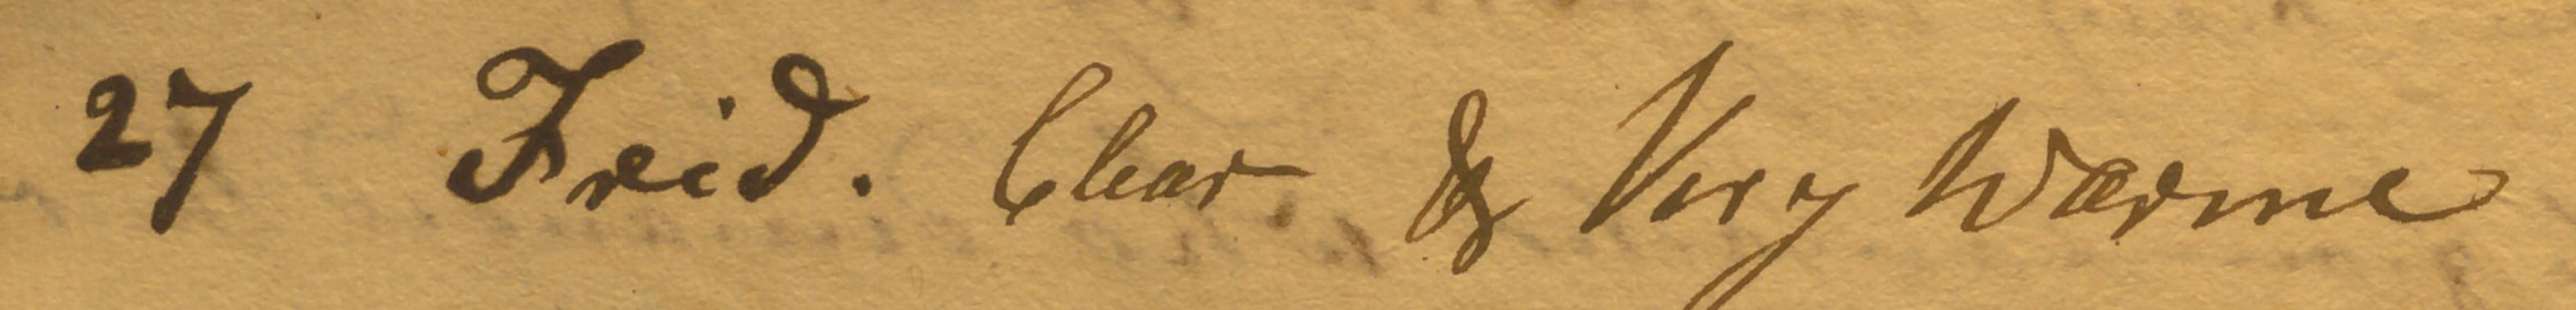27 Frid. Clear. & Very Warme
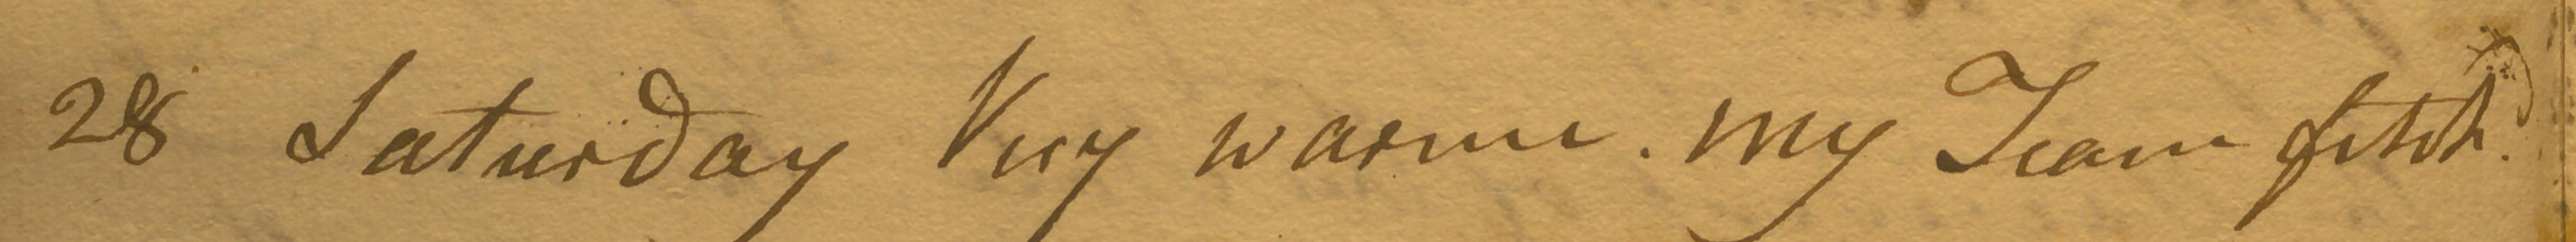28 Saturday Very warme. my Team fetch^d:
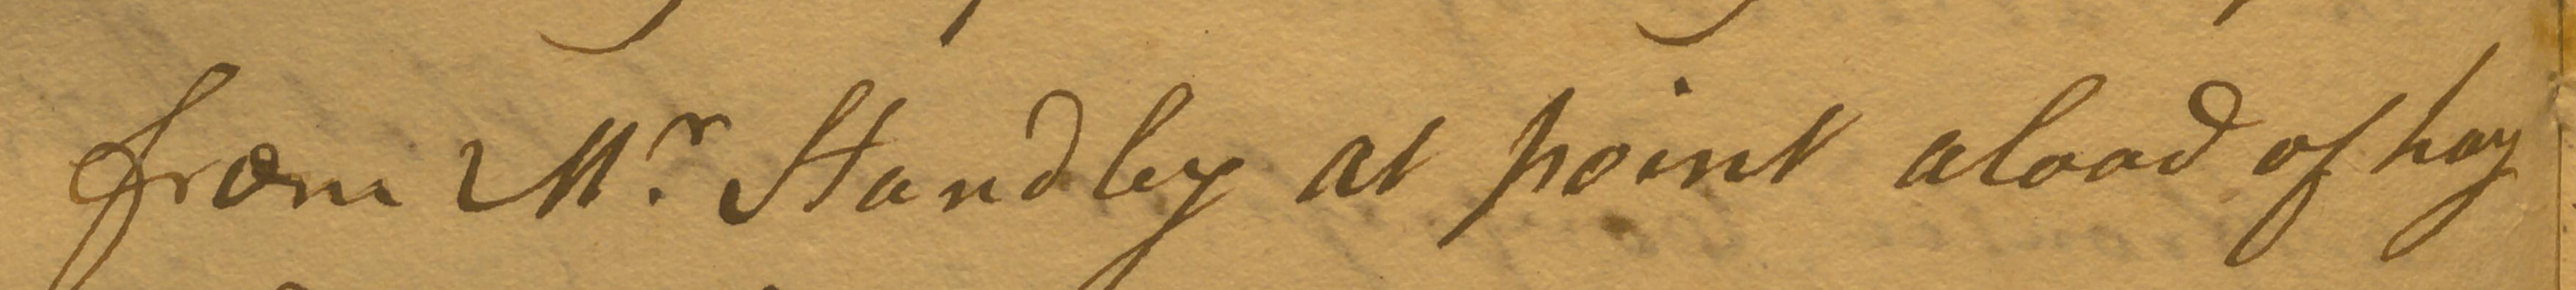from M^r. Standley at point a load of hay
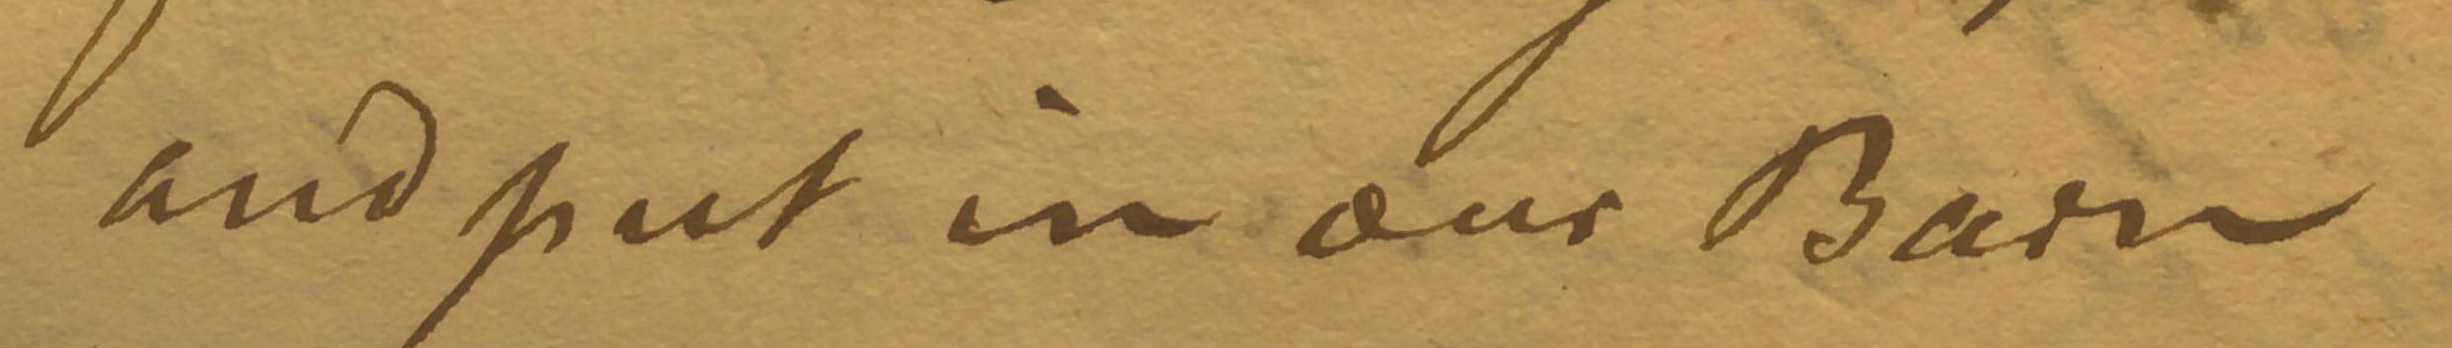and put in our Barn
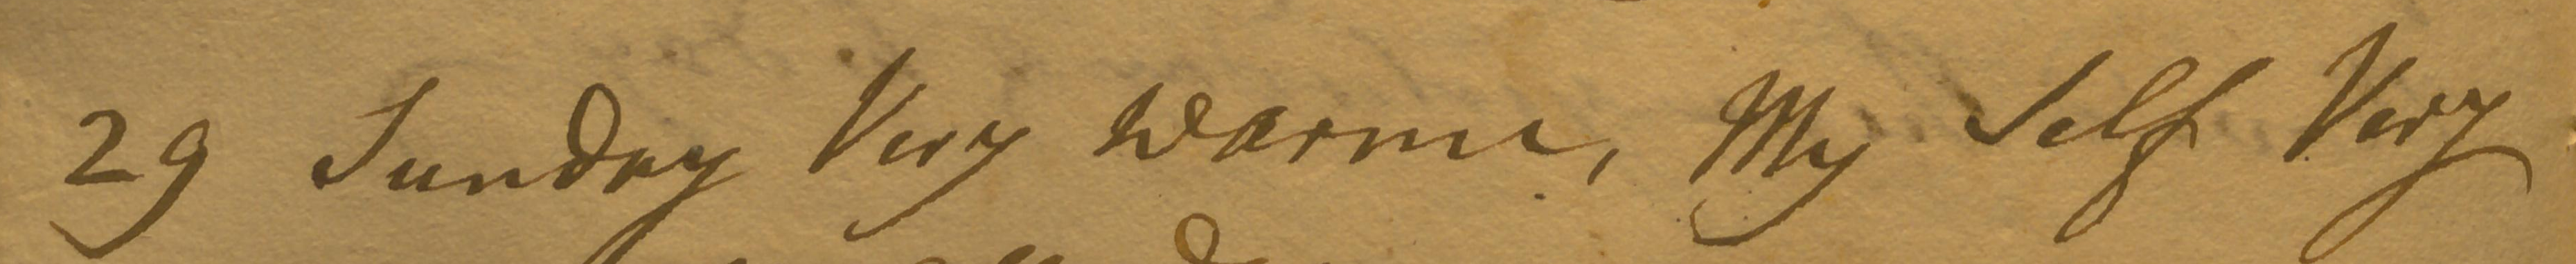29 Sunday Very warme, My Self Very
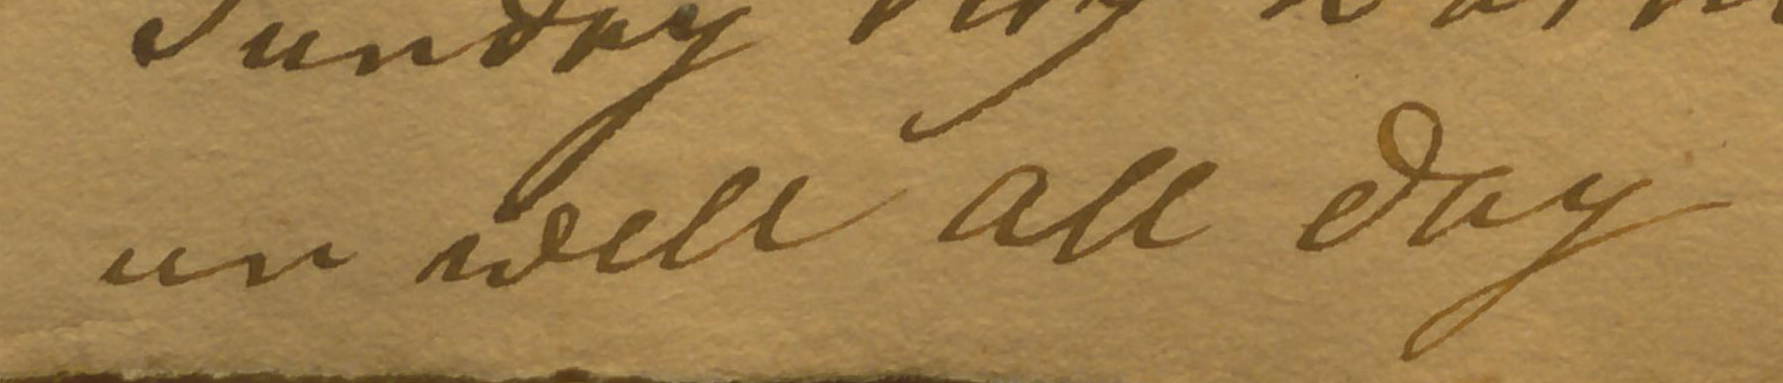unwell all day
